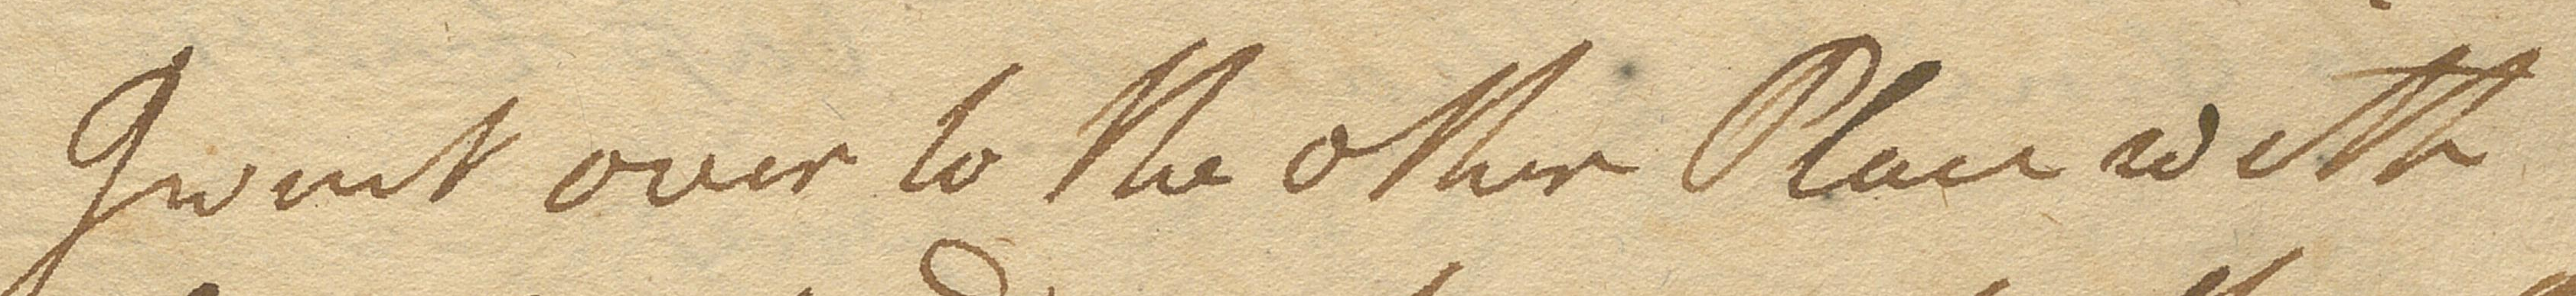I went over to the other Plan with
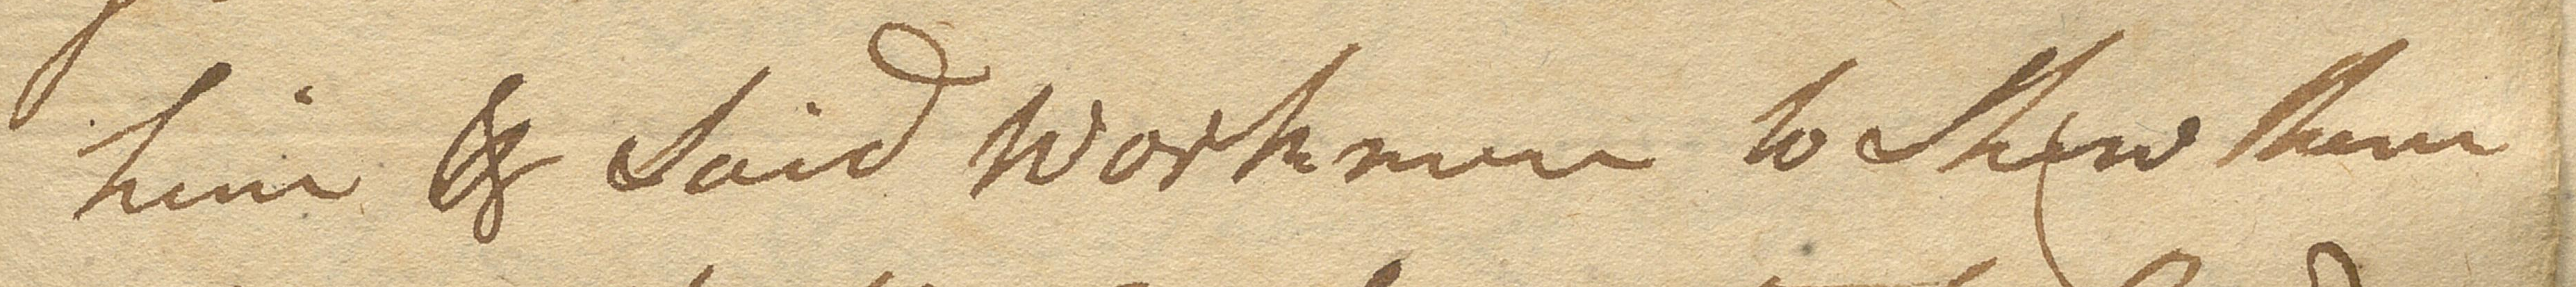him & Said Workmen to shew them
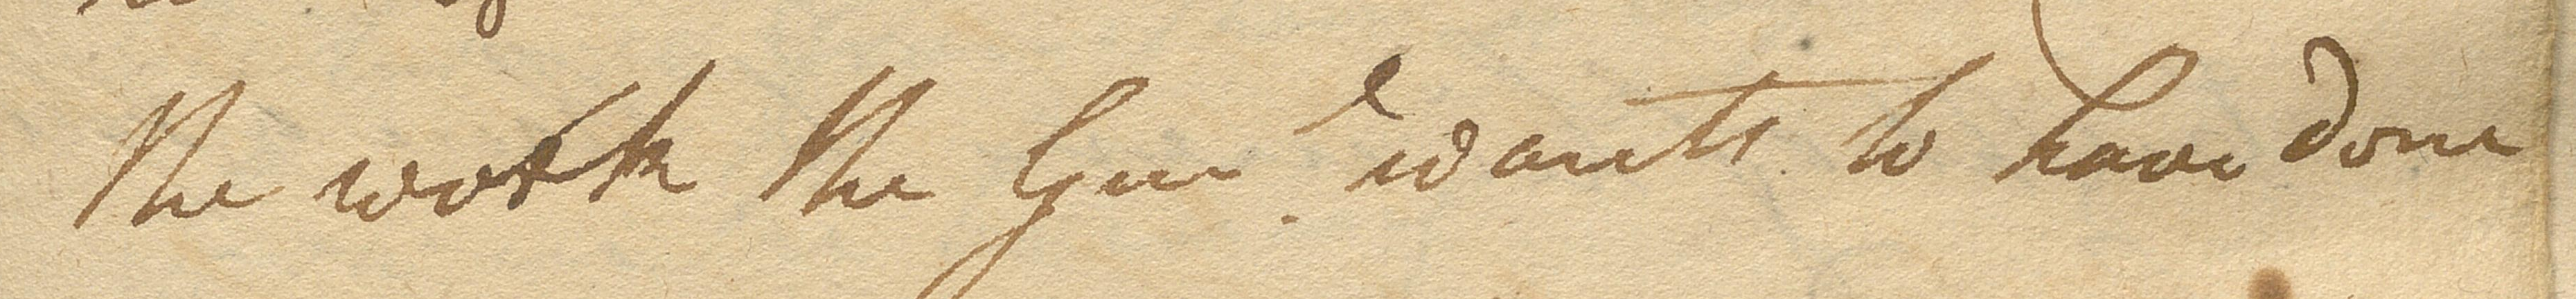the work the Gen^l wants to have done
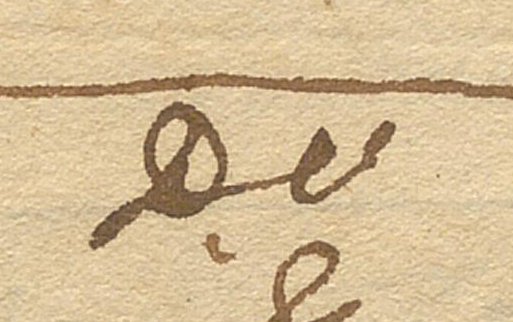D^o.
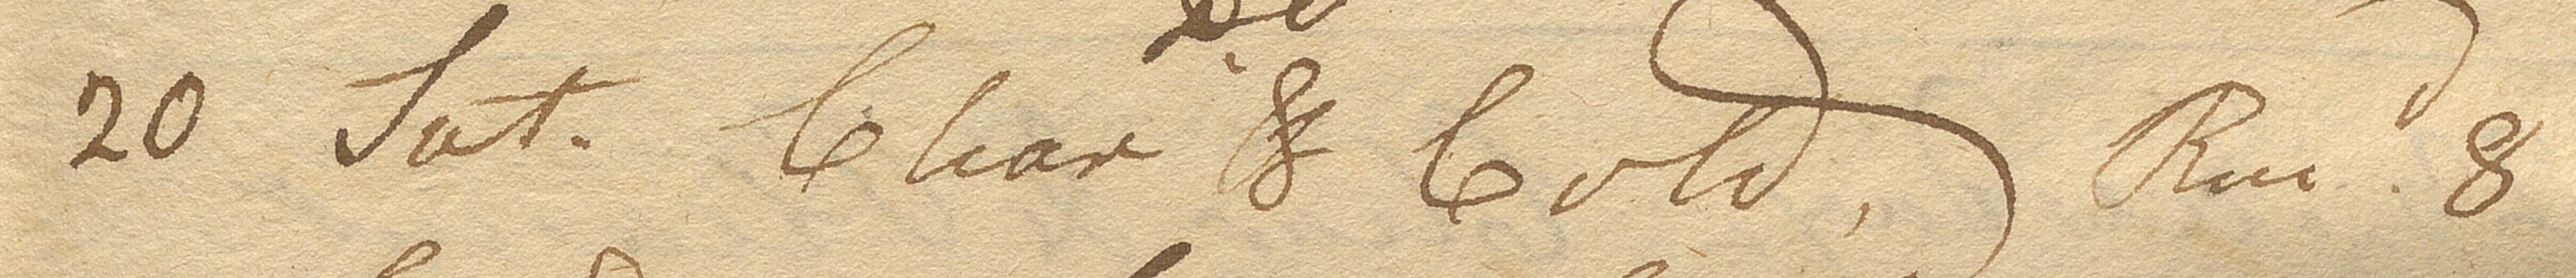20 Sat. Clear & Cold, Rec^d. 8
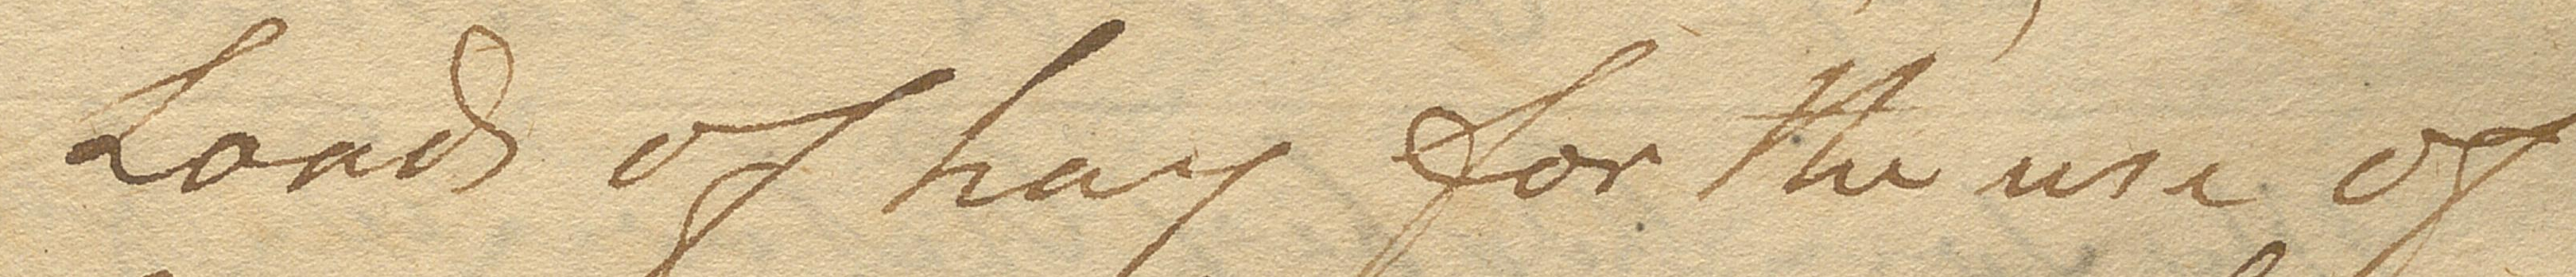Loads of hay for the use of
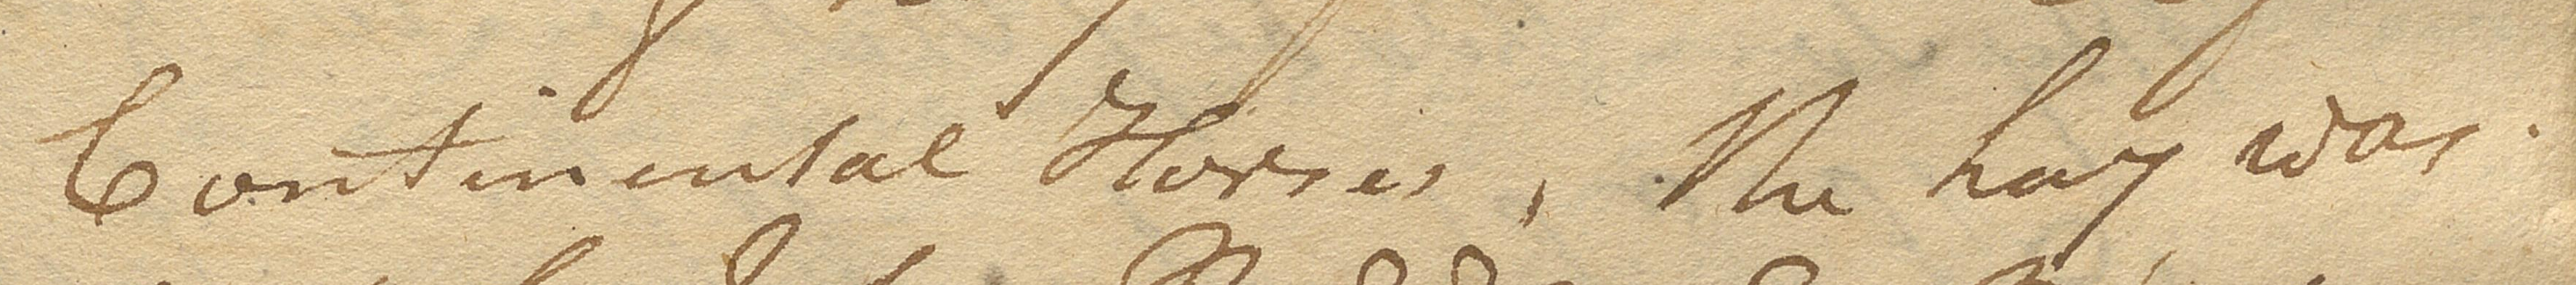Continental Horses, the hay was
